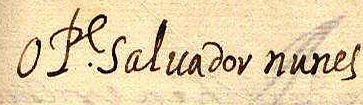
O P.e Saluador nunes
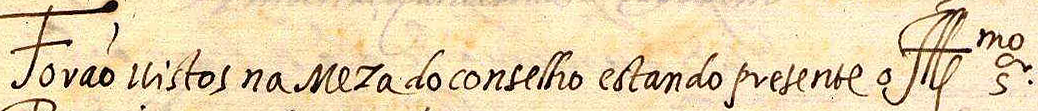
Foraõ uistos na Meza do conselho estando presente o Illꝭmo sor.
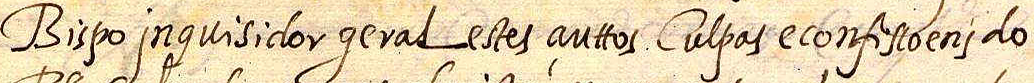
Bispo jnquisidor geral estes auttos Culpas e confissoens do
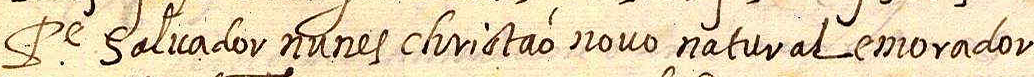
P.e Saluador nunes christaõ nouo naturaL e morador
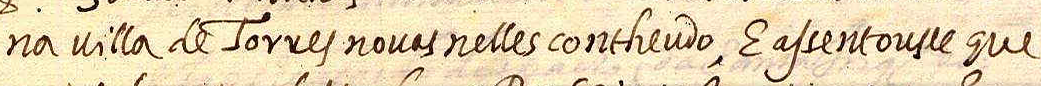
na uilla de Torres nouas nelles contheudo, E assentousse que
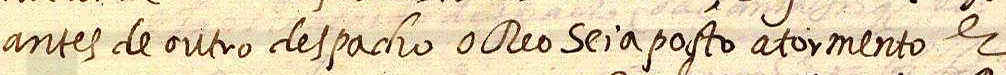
antes de outro despacho o Reo seia posto a tormento E
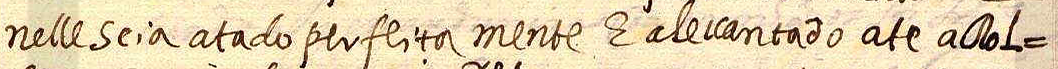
nelle seia atado perfeitamente E aleuantado ate a Rol
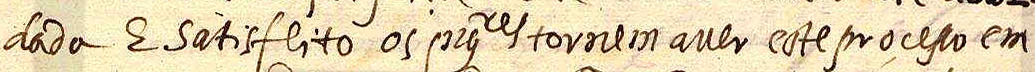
dada E satisfeito os jnqres tornem a uer este processo em
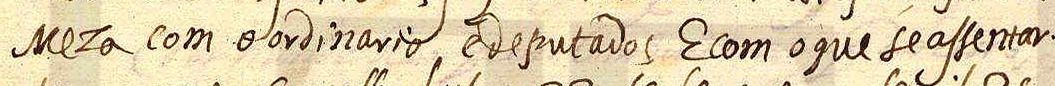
Meza com o ordinario e deputados E com o que se assentar
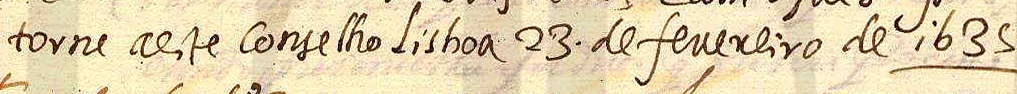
torne a este conselho Lisboa 23. de feuereiro de i635
